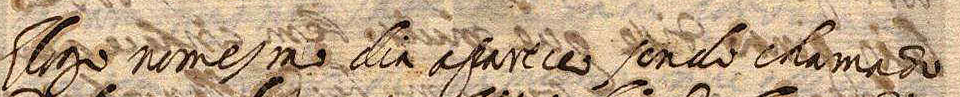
E logo no mesmo dia apareceo sendo chamado
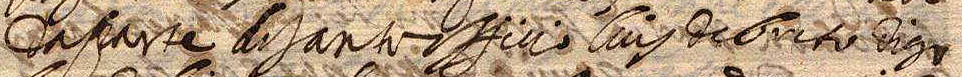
da parte do santo officio luis de brito digo
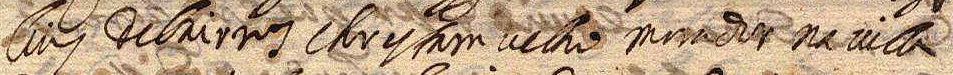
luis de bairros christam uelho morador na uilla
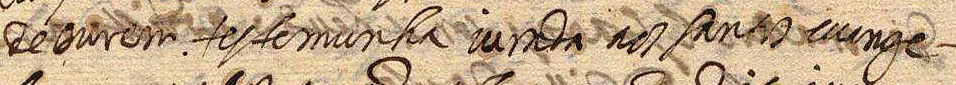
de ourem. testemunha iurada aos santos euange
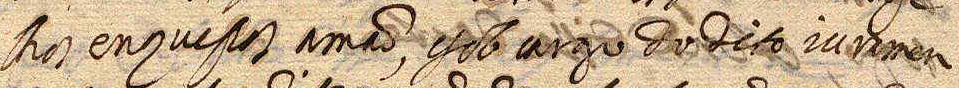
lhos en que pos a maõ, e sob cargo do dito iuramen
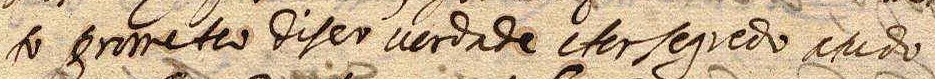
to prometeo diser uerdade e ter segredo a tudo
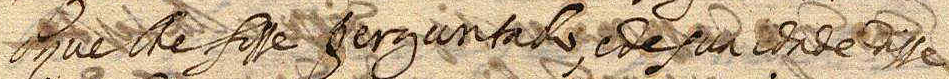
o que lhe fosse perguntado, e de sua idade disse
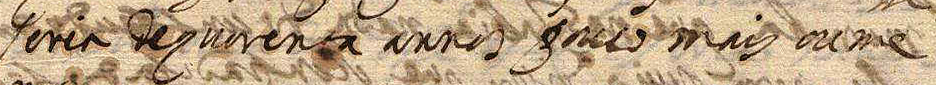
seria de quorenta annos pouco mais ou me
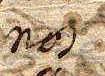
nos
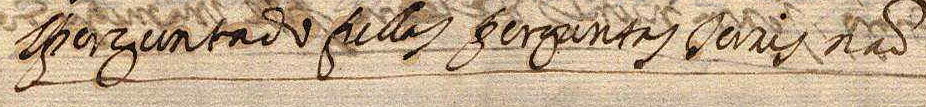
E perguntado pellas perguntas jerais naõ
